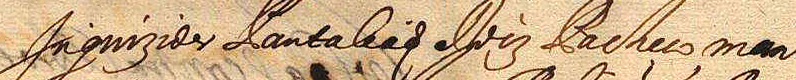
Jnquizidor Pantaliaõ Roiz Pacheco, man
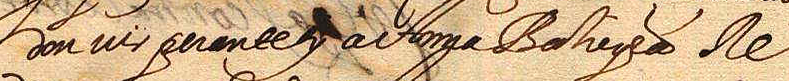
dou uir perante sy a Anna Balieyra Re
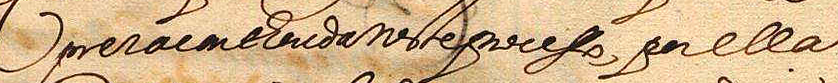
preza contheuda neste processo, por ella
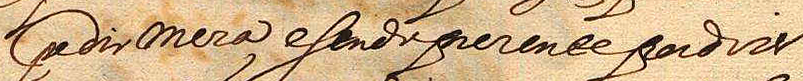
pedir meza, e sendo prezente por dizer
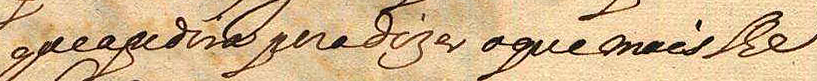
que pedira pera dizer o que mais lhe
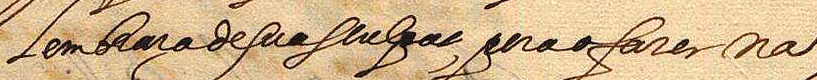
Lembrara de suas culpas, pera o fazer na
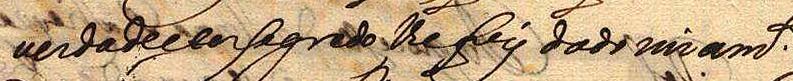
uerdade, e ter segredo, lhe foy dado iuram.to
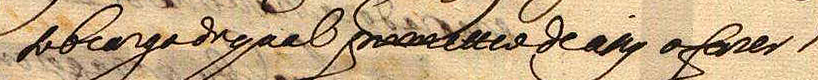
sob cargo do qual prometteo de assy o fazer
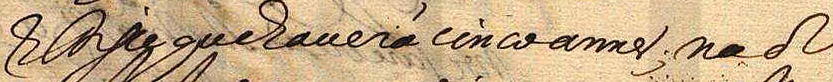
E disse que hauerá cinco annos; naõ
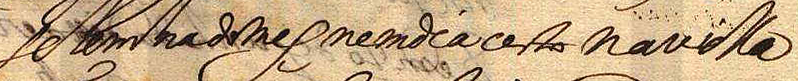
se lembra do mes, nem dia certo na villa
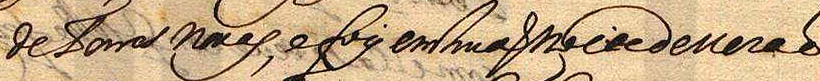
de Torres nouas, e foy em huā noite de ueraõ,
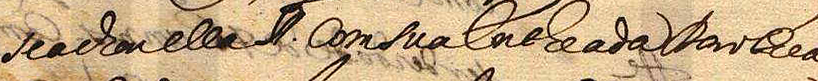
se achou ella R. com sua Entheada Dorothea
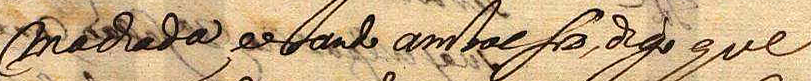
Machada, estando ambas sos, digo que
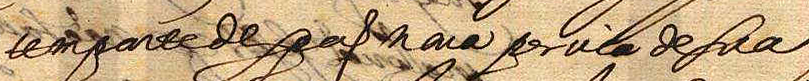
tem parte de xpā noua por uia de sua,
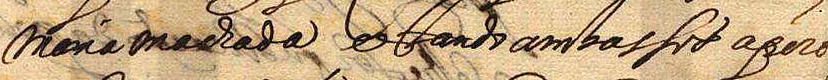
Maria machada, e estando ambas sos a port
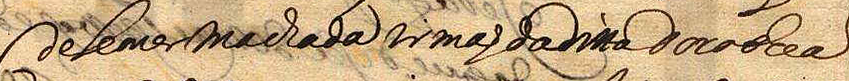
de leonor machada irmā da ditta Dorothea
